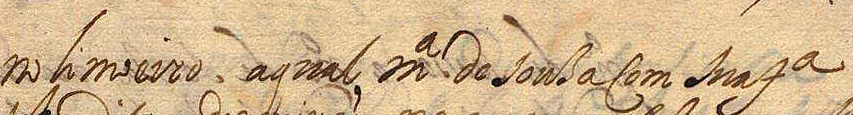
no limoeiro a qual ma de Souza Com sua fa
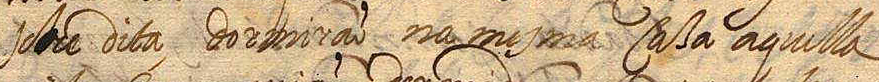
sobredita, dormiraõ na mesma Caza aquella
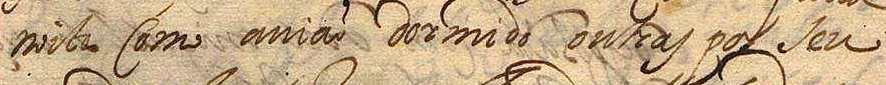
noite Como auiaõ dormido outras por seu
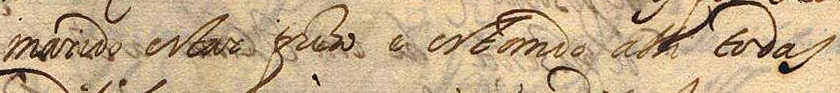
marido estar prezo e estamdo assi todas
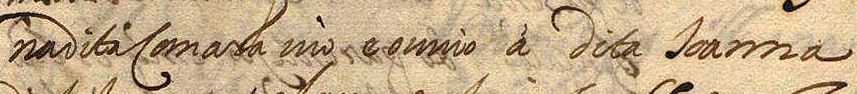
na dita Camara uio e ouuio a dita Ioanna
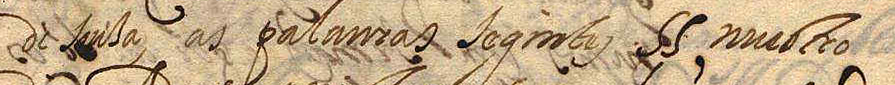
de souza, as palauras segintes .SS. nuestro
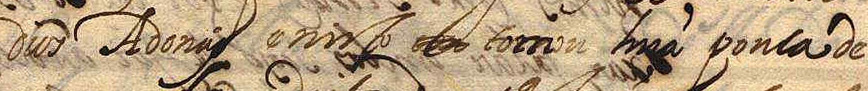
dios Adonaj e nisto em tomou huā pouca de
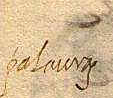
palauras
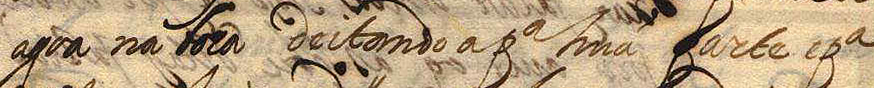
agoa na boca deitando a pa huā parte e pa
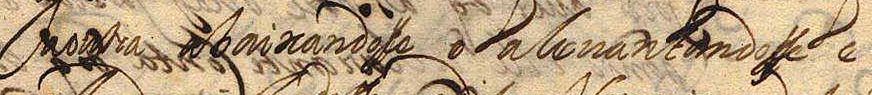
a outra abaixandosse e aleuantandosse e
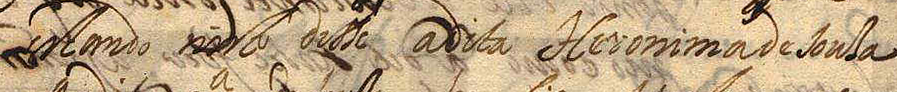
estando nisto disse a dita Heronima de Souza
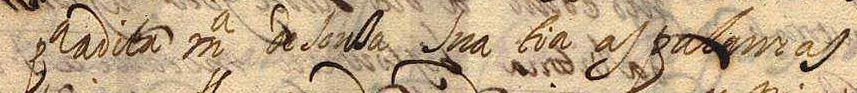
pa a dita ma de souza Sua tia as palauras
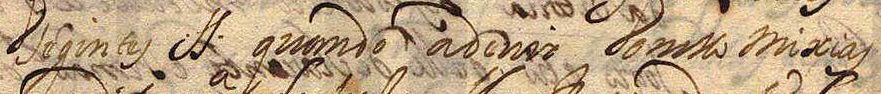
segintes .SS. quando a de uir o nosso mixias
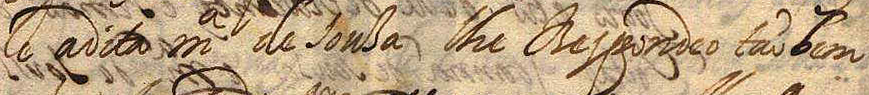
e a dita ma de Souza lhe Respondeo taõbem
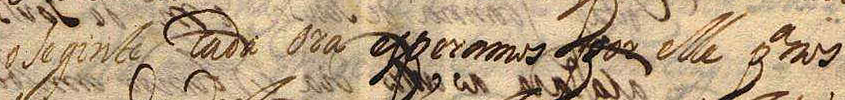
o seguinte cada ora esperamos por elle p.a nos
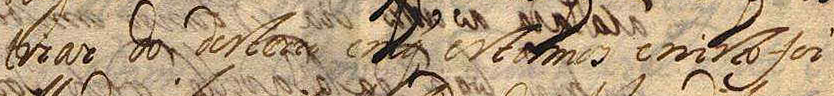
tirar do desterro em q̄ estamos e nisto foi
